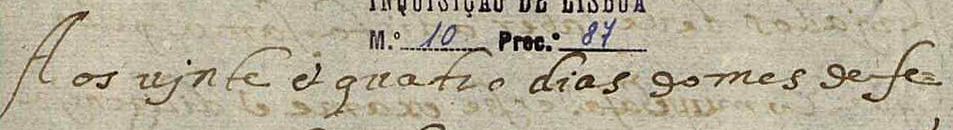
Aos ujnte & quatro dias do mes de fe
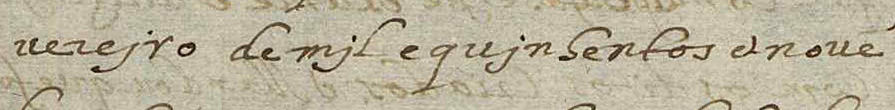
uerejro de mjl e quijnhentos & nouē
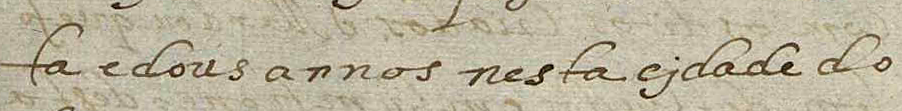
ta e dous annos nesta cjdade do
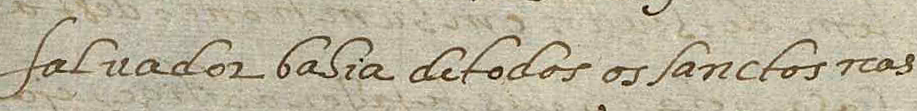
Saluador bahia de todos os sanctos nas
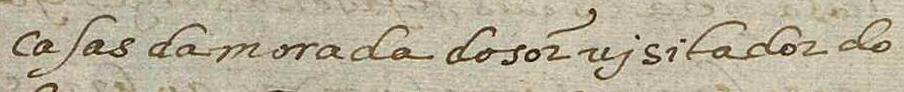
casas da morada do sor̄ ujsitador do
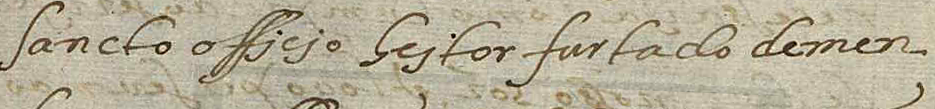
Sancto offjcjo hejtor furtado de men
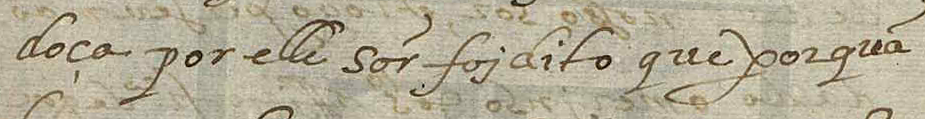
doça por elle sor̄ foj dito que porquā
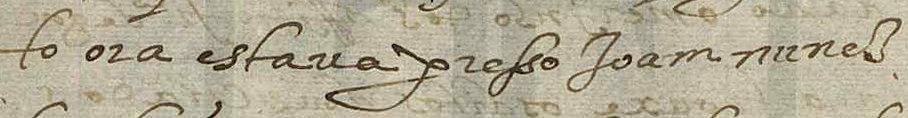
to ora estaua presso Joam nunez
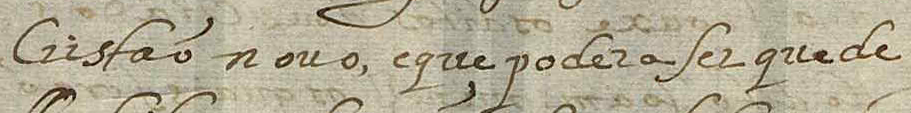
Cristaõ nouo, e que podera ser que de
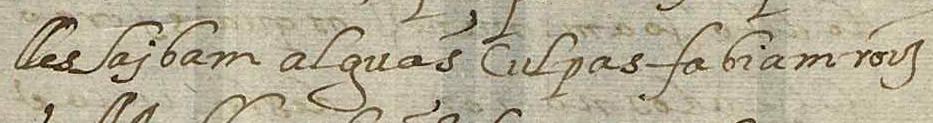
lles Sajbam alguas̄ culpas fabiam rōiz
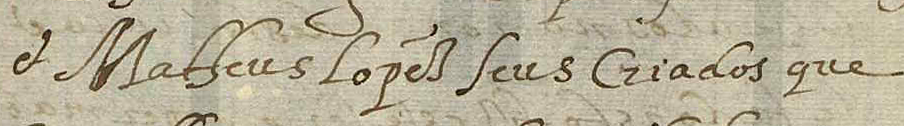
& Matheus Lopēz seus Criados que
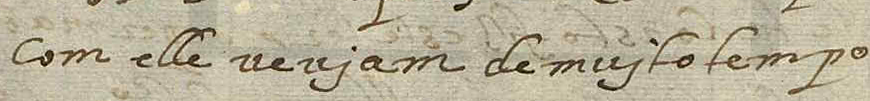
com elle ueujam de mujto tempo
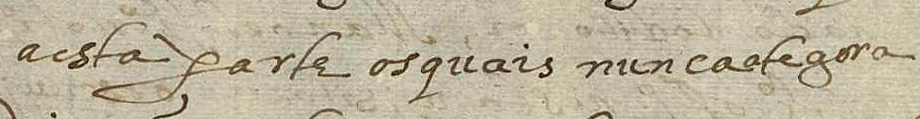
a esta parte os quais nunca ate gora
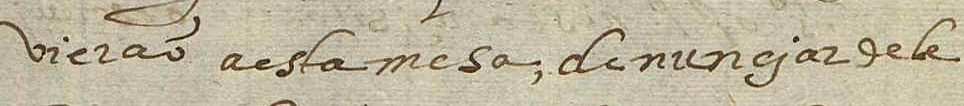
vieraõ aesta mesa, denuncjar dele
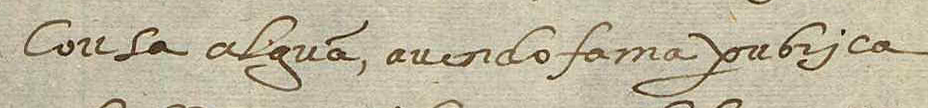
Cousa alguā, auendo fama pubrjca
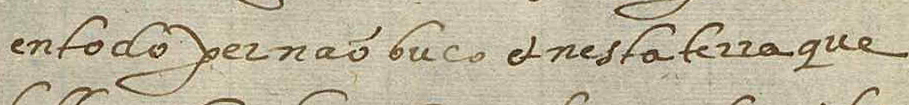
en todo pernaõbuco & nesta terra que
